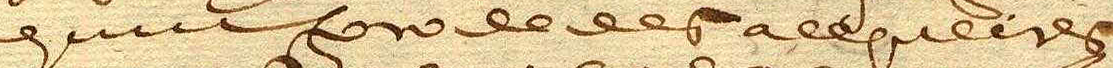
hum foro de des allqueires
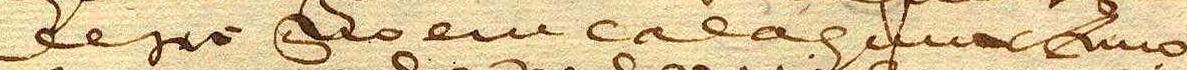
de triguo em cada hum Anno
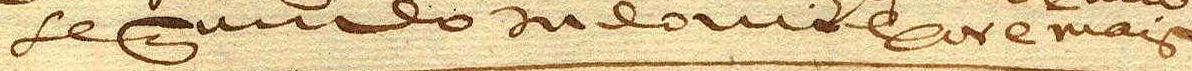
segumdo tudo milhor e mais
